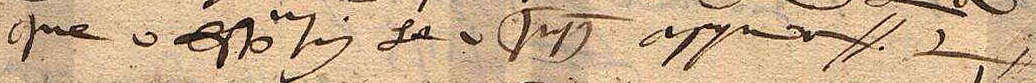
que o Esp̄vy he o Juiz asynou //.
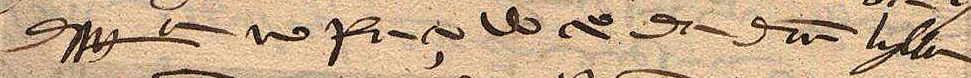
dssga no paço do co da dt̄a vylla
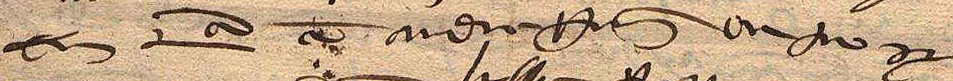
Eu tā c̄o andre gēz outrosy
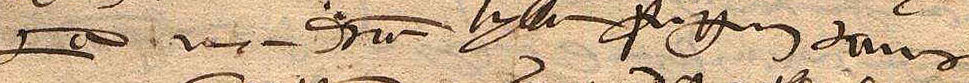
tā na dt̄a vylla perguntamos
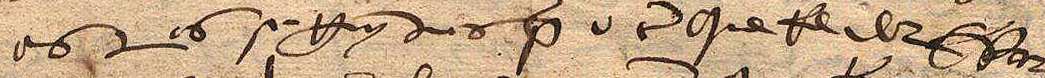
as tas seguj̄tes p̄o o ēqueRedor Estar
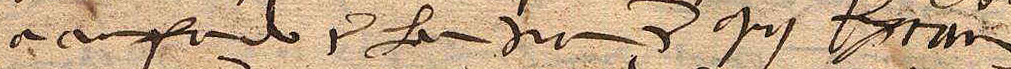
ocupado ē houtra ēqujRyçam
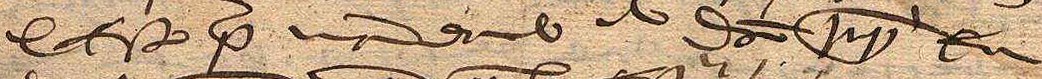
e Esto p̄o mādado do dt̄o Juiz Eu
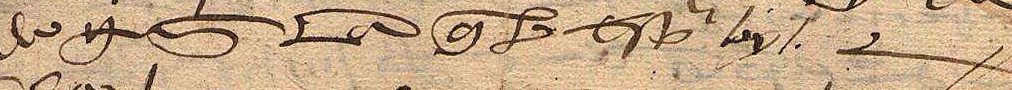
do gēz tā q̄ ho Esp̄vy /.
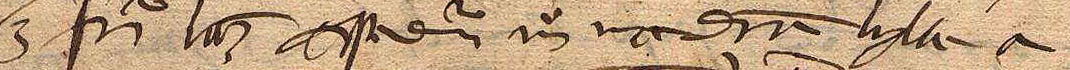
item frco vāz Escodro mo na dt̄a vylla a
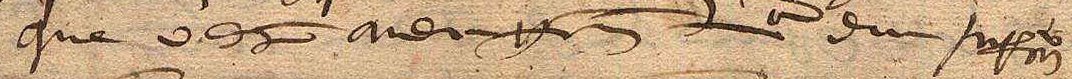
que o dt̄o andre gēz tā deu JuRamto
